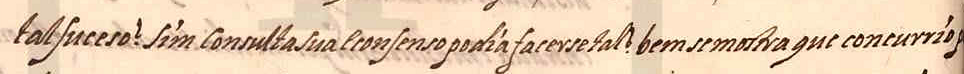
tal suceso? Sim consulta sua e consenso podia fazerse tal? bem se mostra que concurrio
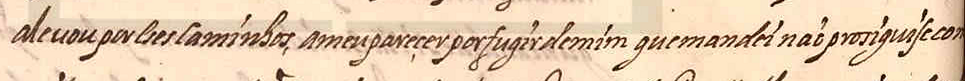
a leuou por eses caminhos, a meu parecer por fugir de mim que mandei naõ prosiguise con
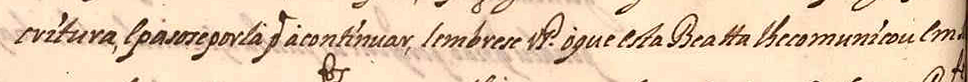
critura, E pasose por la pa a continuar, lembrese vP. o que esta Beatta lhe comunicou em
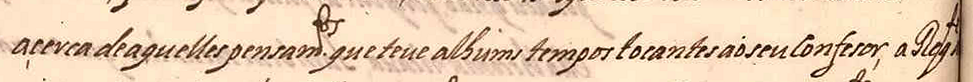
acerca de aquelles pensam.tos que teue alhums tempos tocantes ao seu confesor, a Regte
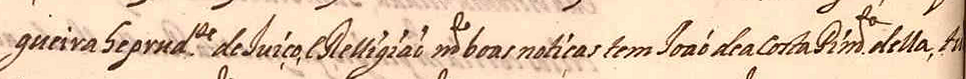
gueira he prud.te de Iuiço, e Relligiaõ mto boas notiças tem Ioaõ de acosta Pim.ta della, tu
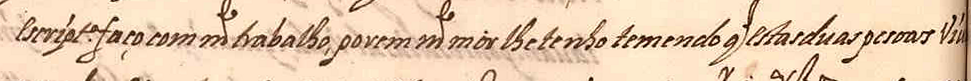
escript.a faço com mto trabalho, porem mto mor lhe tenho temendo q̄ estas duas pesoas viu
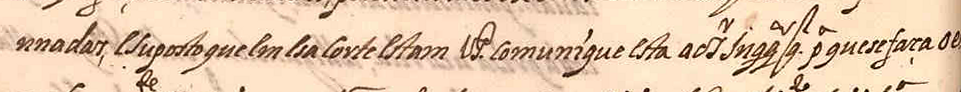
nnadas, e suposto que em esa corte estam VP. comunique esta ao sr Inqqor g.l p.a que se faça o e
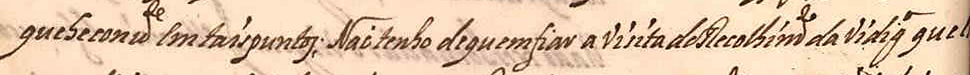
que he conute em tais puntos, Naõ tenho de quem fiar a visita do Recolhim.to da vidiga que
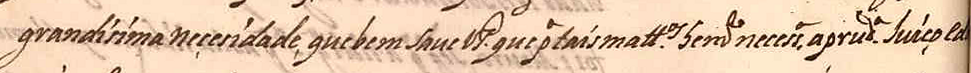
grandisima necesidade, que bem saue vP. que pa tais matt.as he mto necess.a a prud.a Iuiço e a
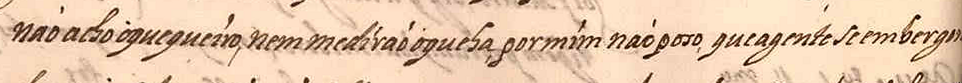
naõ acho o que queiro, nem me diraõ o que ha, por mim naõ poso, que a gente se embergo
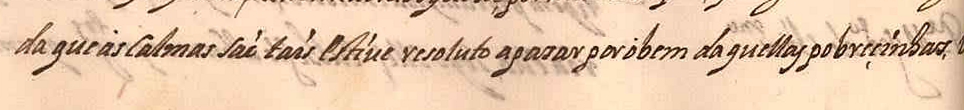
da que as calmas saõ tais estiue resoluto a pasar por o bem daquellas pobrecinhas
